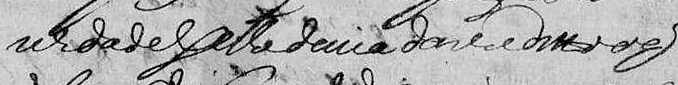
uerdade se lhe deuia da creditto o q̄
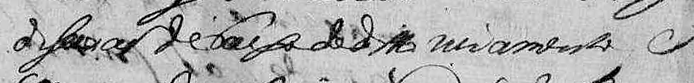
disseraõ debaixo do ditto iuramento e
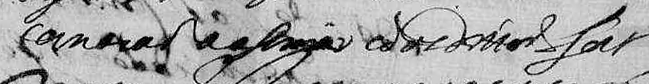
tornaraõ a assinar cō os dittos sors̄
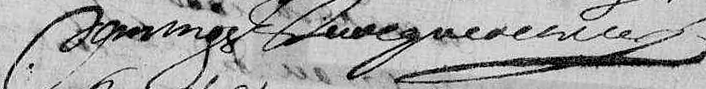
Domingos Esteues que o escreuj
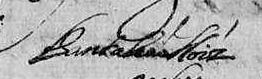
Pantaleaõ Roiz̄
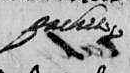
pacheco
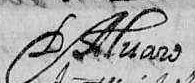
D Aluaro
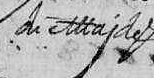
de Attajde
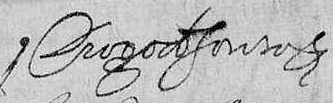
Diogo d̄ sousa
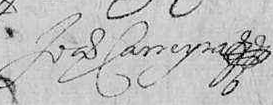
Joaõ Carreyra
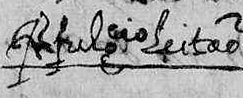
fr̄ fulgcio Leitaõ
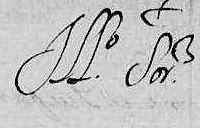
Ill.o Sor̄.
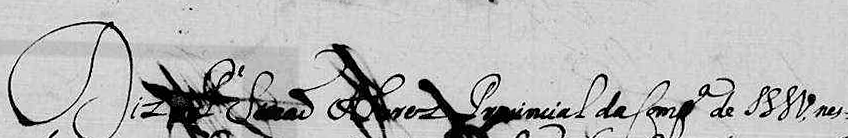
Diz o Pe Simaõ Alurez Prouincial da Comp.a de IESV, nes
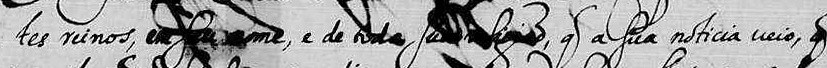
tes reinos, em seu nome, e de toda sua religiaõ, q̄ a sua noticia ueio, q̄
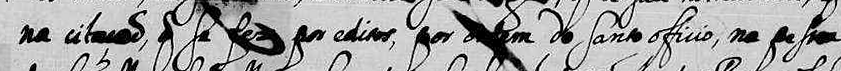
na citaçaõ, q̄ se fez por editos, por ordem do Santo officio, na pessoa
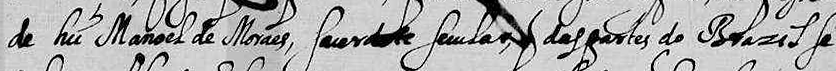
de hū Manoel de Moraes, Sacerdote Secular, q̄ das partes do Brazil se
